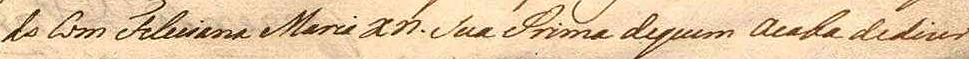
do Com Feleciana Maria x n. sua Prima de quem acaba de dizer
